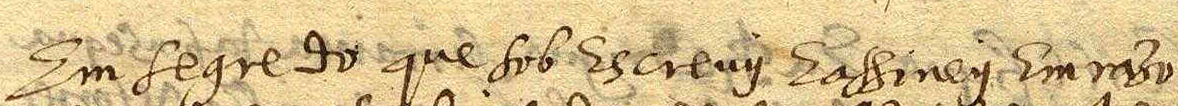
Em segredo que sobEscreuy E assiney Em razo
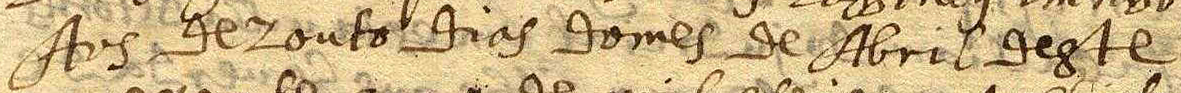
Aos dezouto dias do mes de Abril deste
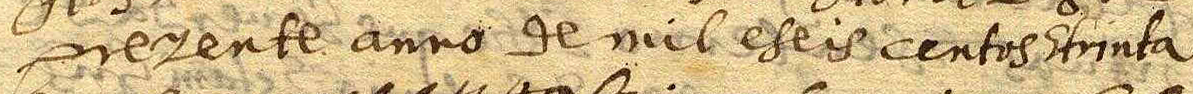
prezente anno de mil e seiscentos E trinta
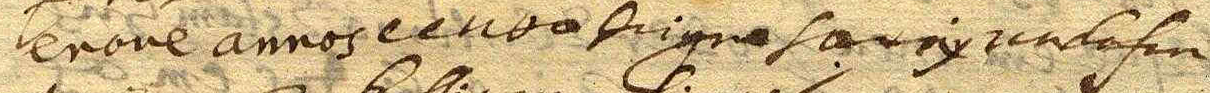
e noue annos e eu Rodriguo sarayua da fon
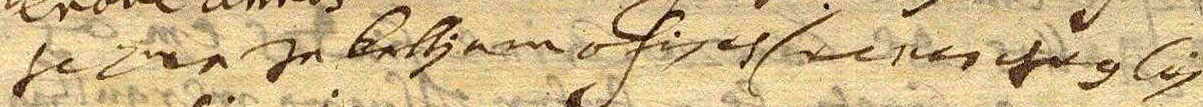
sequa taballjam o fis esCreuer e suesCrj
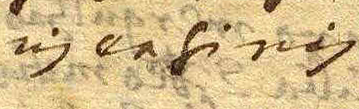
uj e asinej
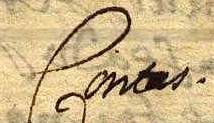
Contas.
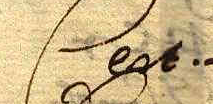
Cert.
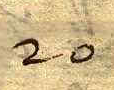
20
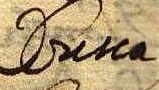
busca
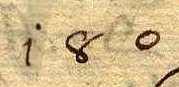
i80
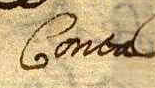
Conta
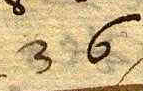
36
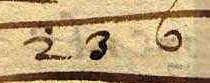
236
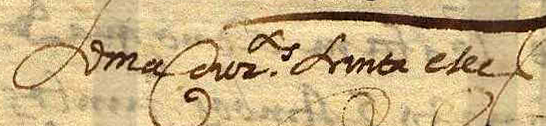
Soma duz.tos trinta e seis
